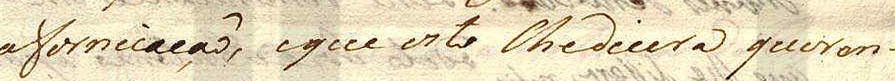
a fornicaçaõ, e que este lhe dicera queiren
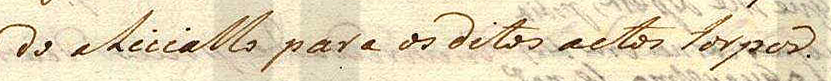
do aLiciallo para os ditos actos torpes.
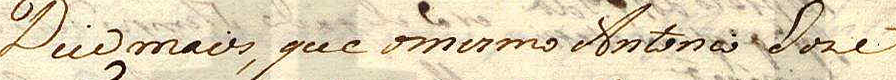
Dice mais, que o mesmo Antonio Ioze
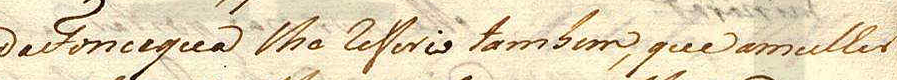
da Foncequa lhe Referio tambem, que a mulher
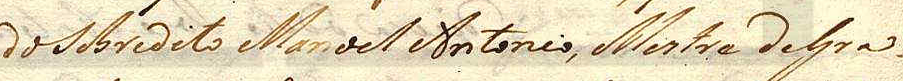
do sobredito Manoel Antonio, Mestre de Gra
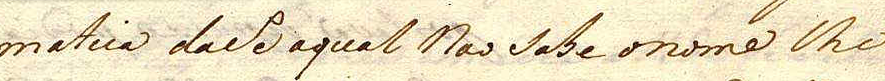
matica da Se a qual Nao sabe o nome lhe
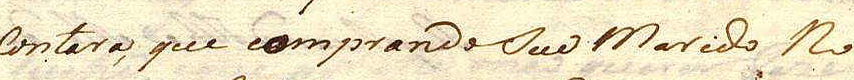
contara, que comprando seu Marido No
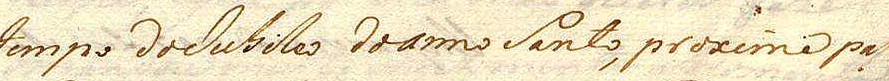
tempo do Iubileo do anno Santo, proximo pas
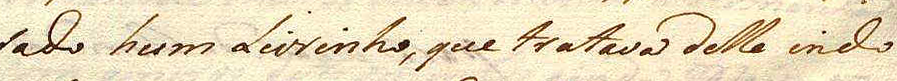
sado hum Leivrinho, que tratava delle indo
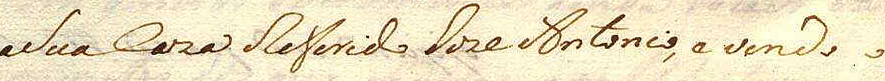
a Sua Caza Referido Ioze Antonio, e vendo o
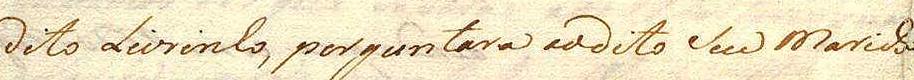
dito Leivrinho, perguntara ao dito seu marido
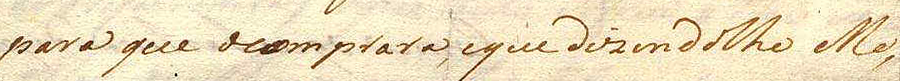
para que o comprara, e que dizendolhe elle,
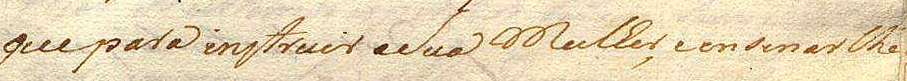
que para instruir a Sua Mulher, e ensenarlhe
